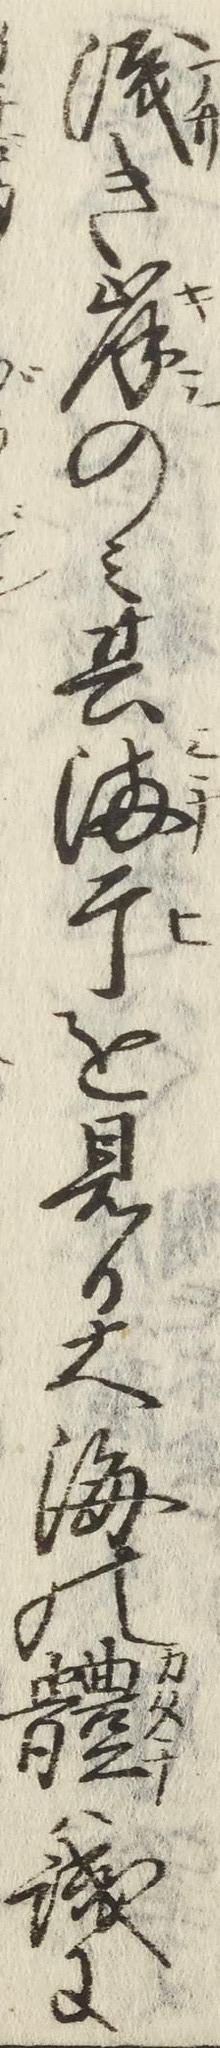浅き岸のみ其満干を見る大海の體は誠に
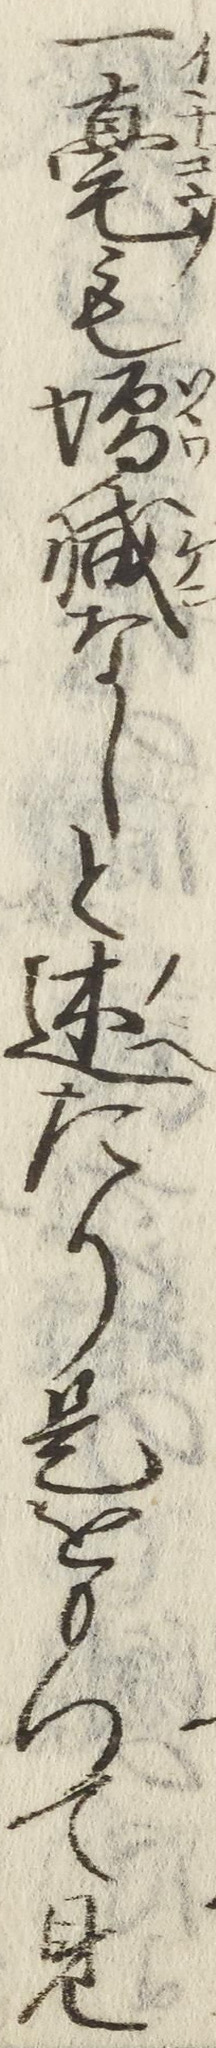一毫も増減なしと述たり是をもつて見
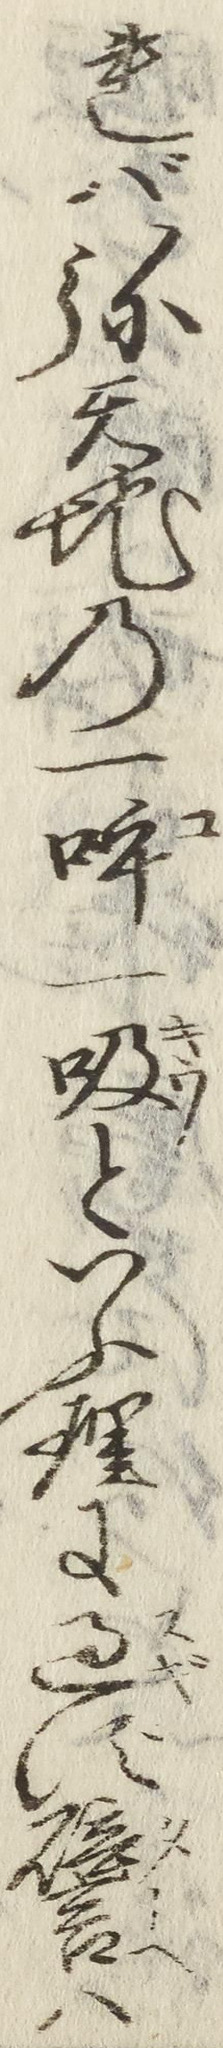れば弥天地の一呼一吸といふ理に過す譬は
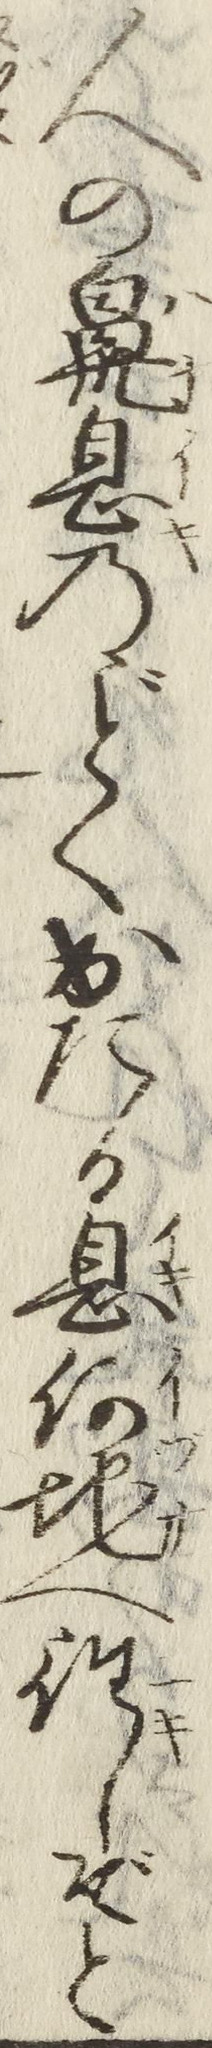人の鼻息のごとく出たる息何地へ往しぞと
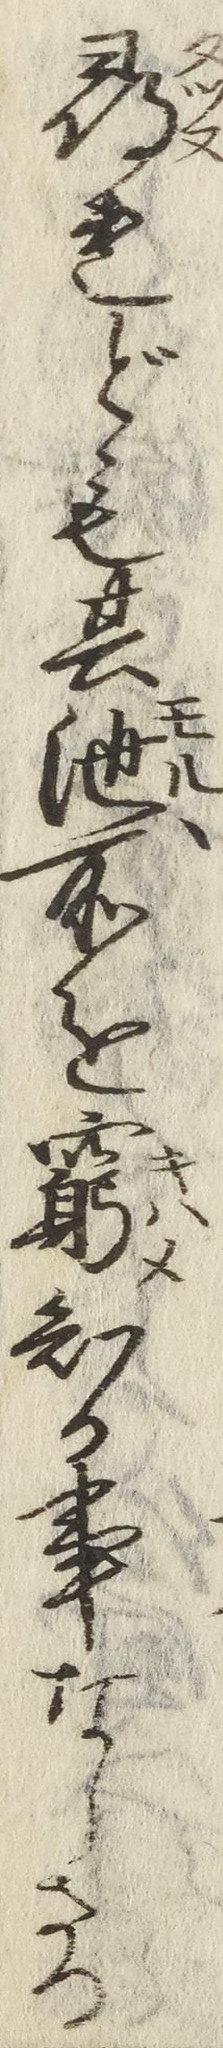尋れども其泄所を窮知る事ならさる

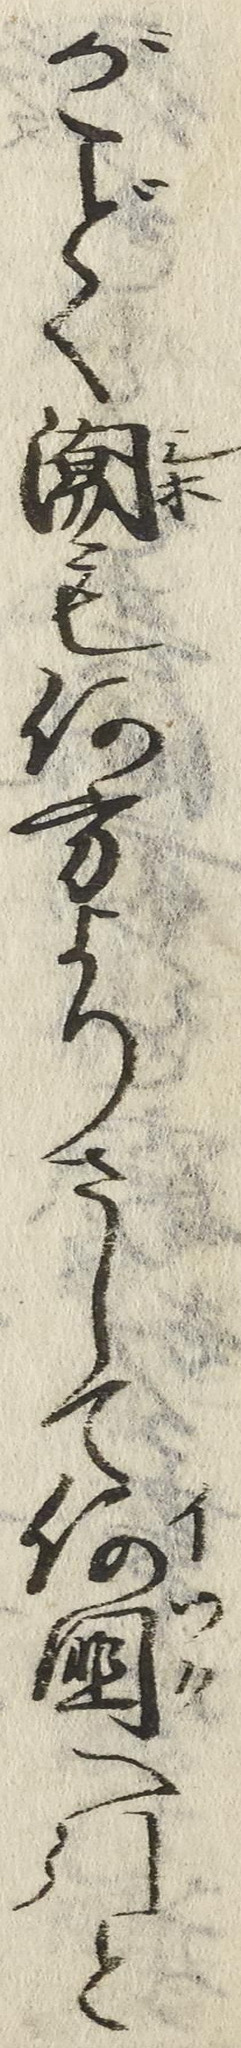がごとく潮も何方よりさして何国へ引と
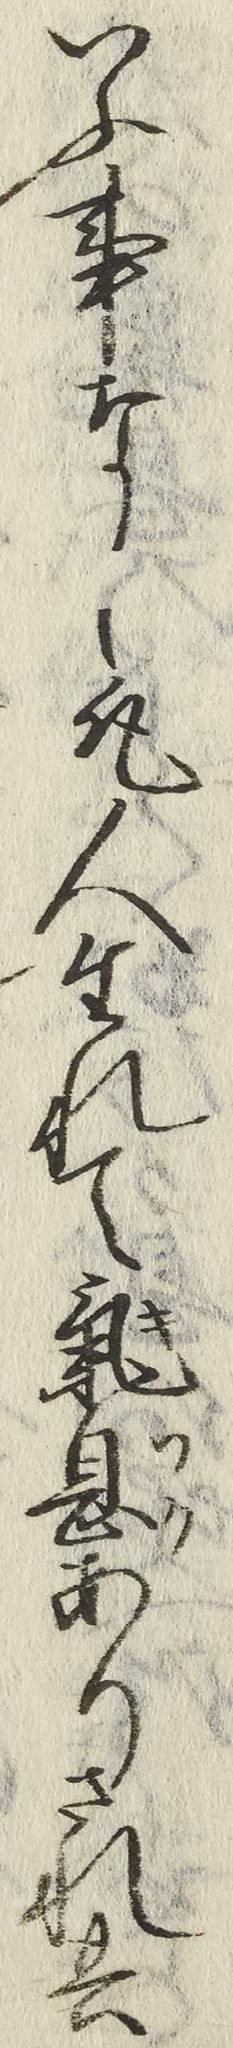いふ事なし凡人生れて気息ありされ共
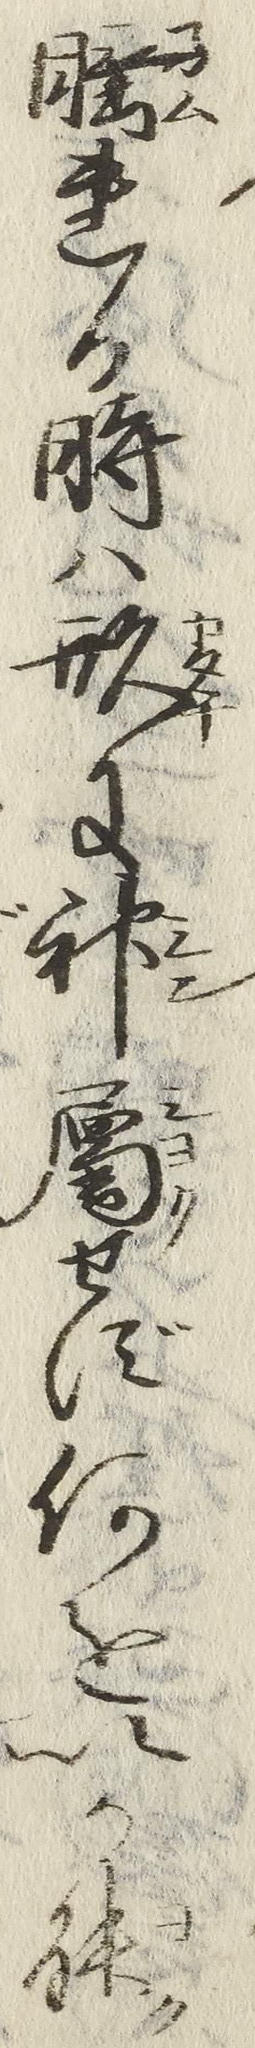睡れる時は形に神属せず何を以か能
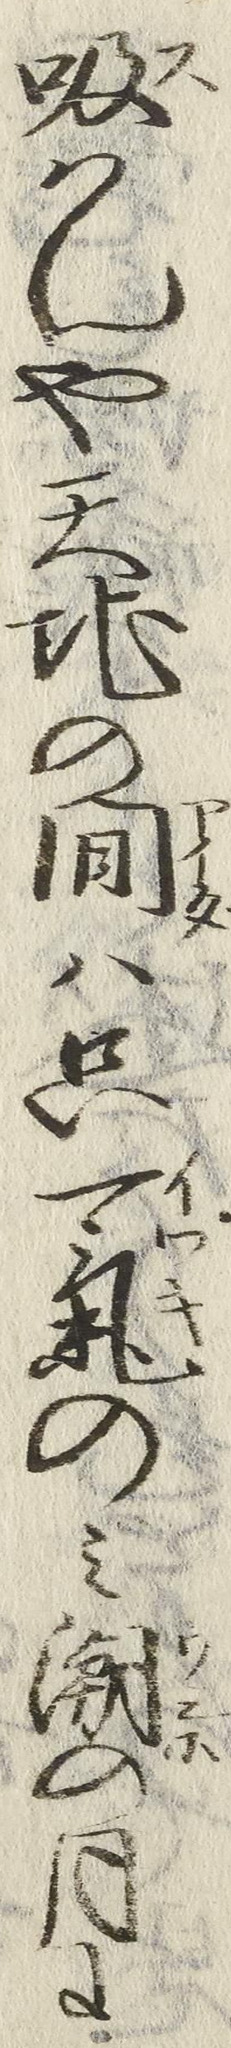吸はんや天地の間は只一気のみ潮の月に
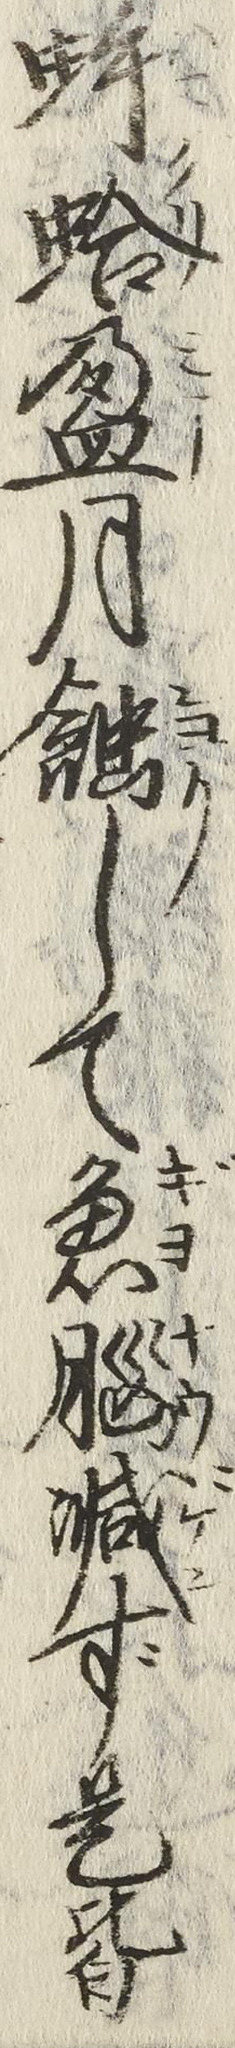して蚌蛤盈月蝕して魚脳減ず是皆
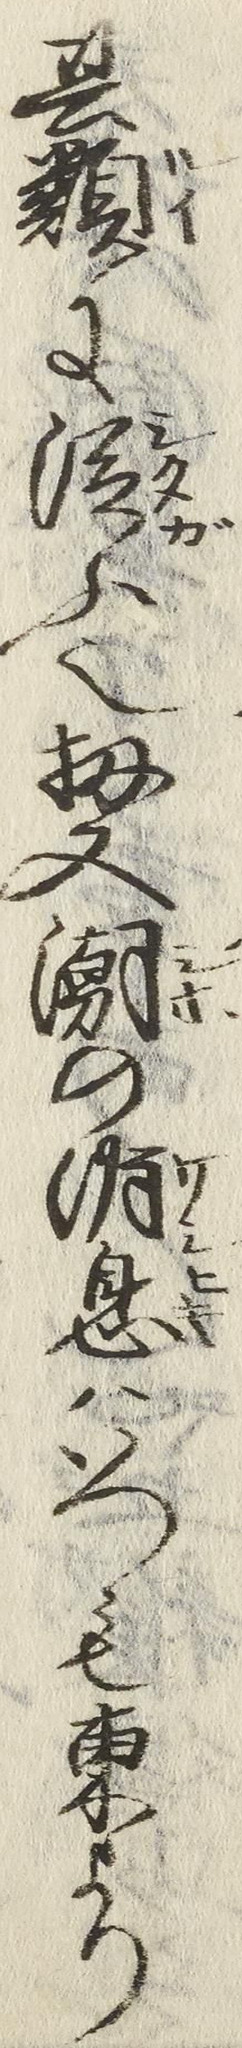其類に従ふ也扨又潮の消息はいつも東より
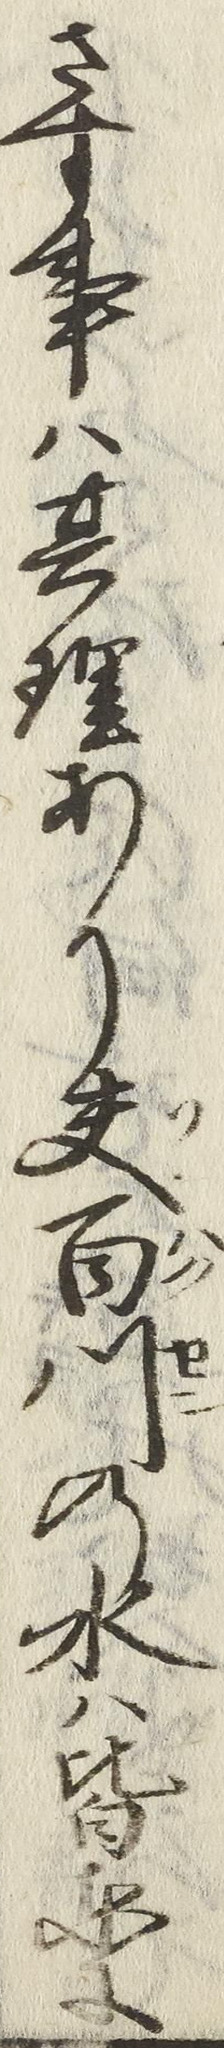さす事は其理あり夫百川の水は皆東に
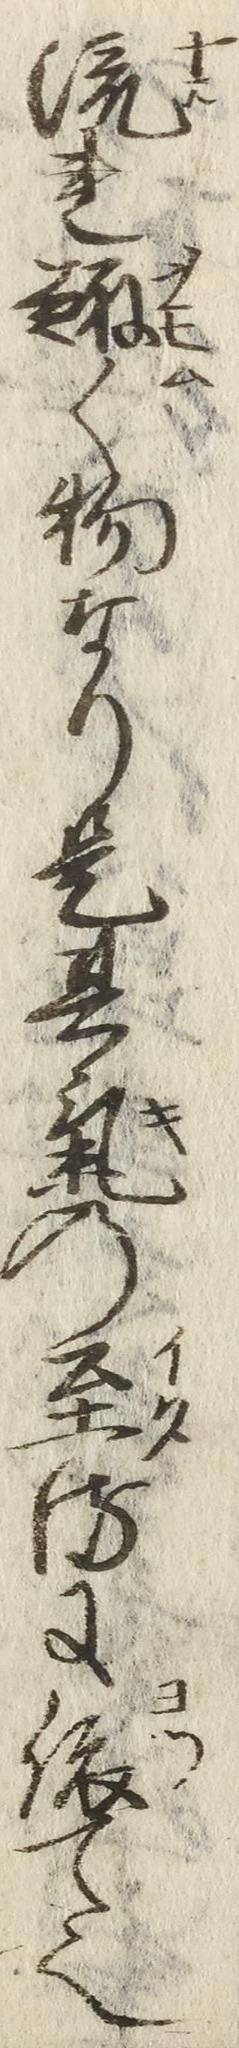流れ趣く物なり是其気の至るに依て也
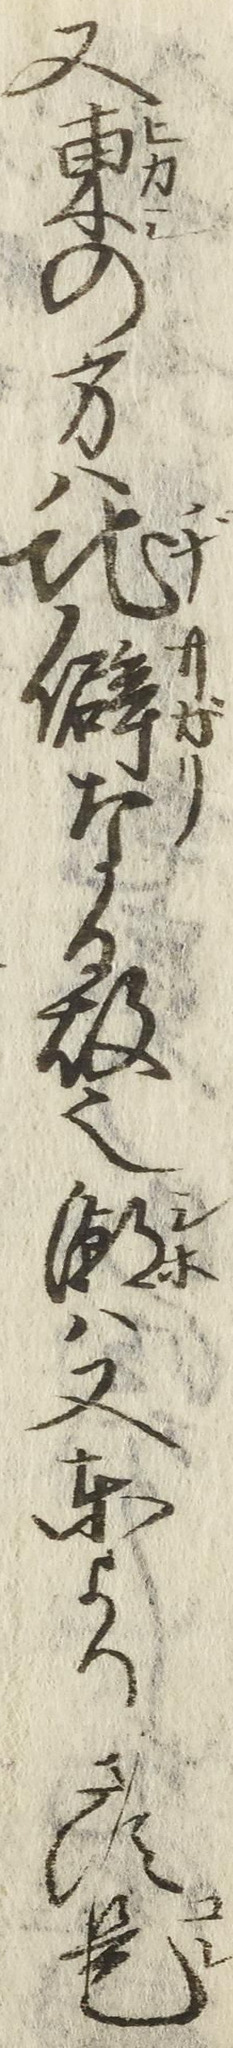又東の方は地僻なる故也潮は又東よりさす是
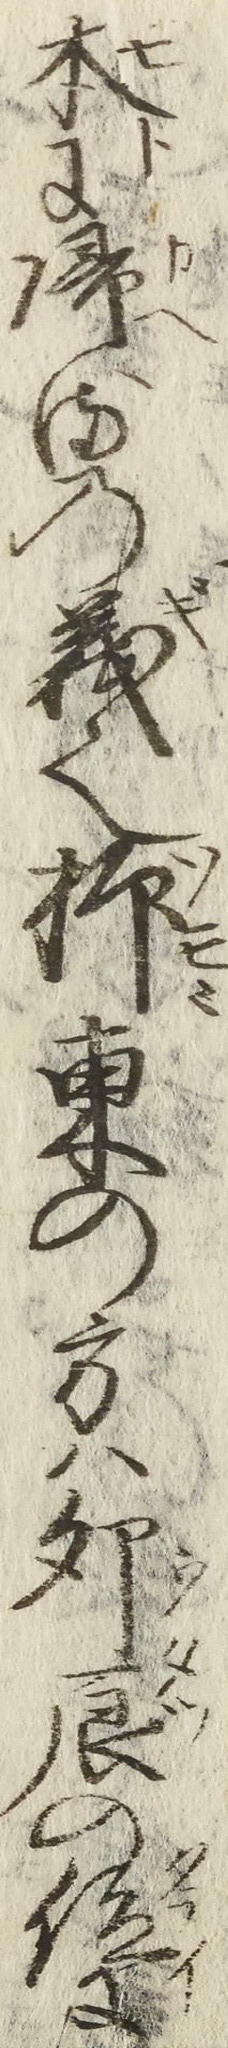本に帰るの義也抑東の方は卯辰の位に
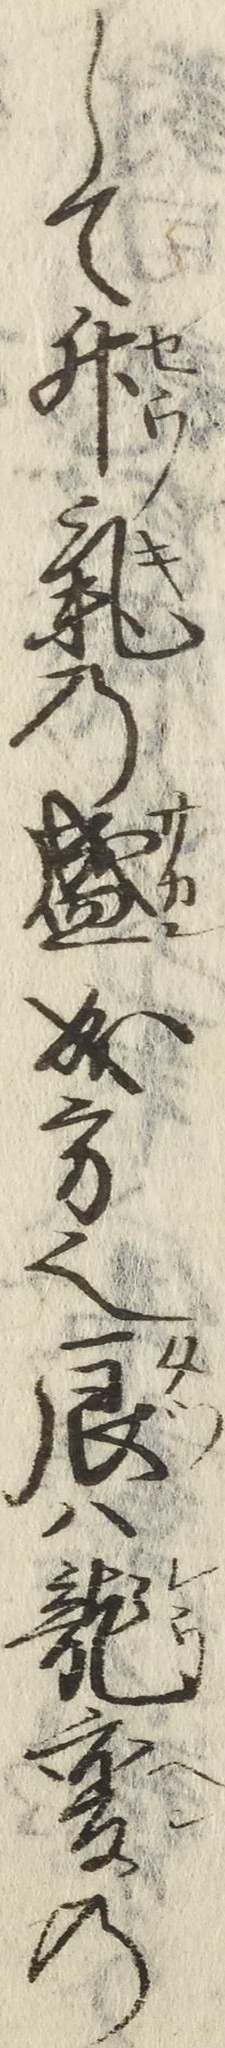して升気の盛成方也辰は龍変の
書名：天地或問珍　天
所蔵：東京大学地震研究所図書室 Earthquake Research Institute Library, The University of Tokyo, JAPAN
